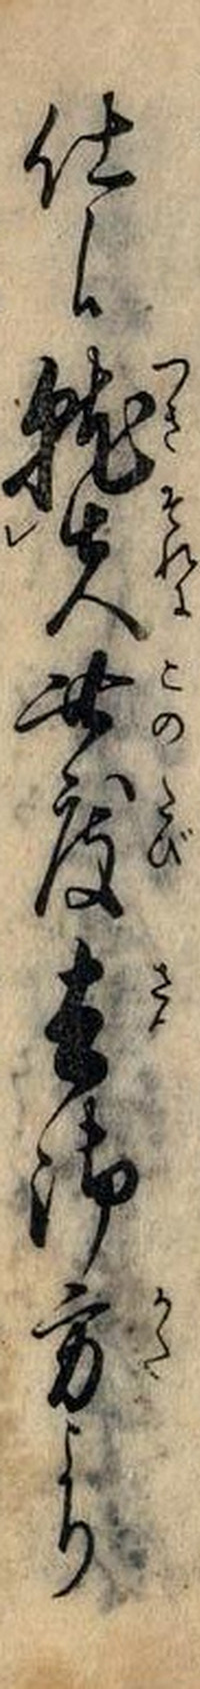仕候就夫此度去御方より
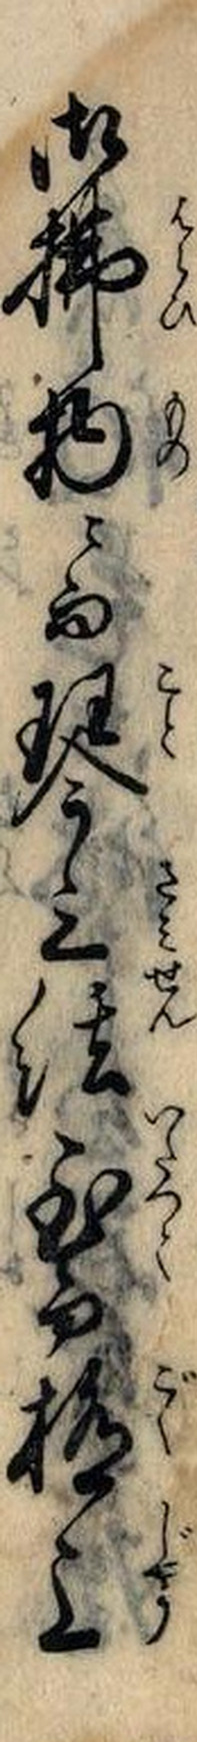御拂物に而琴三絃至而極上
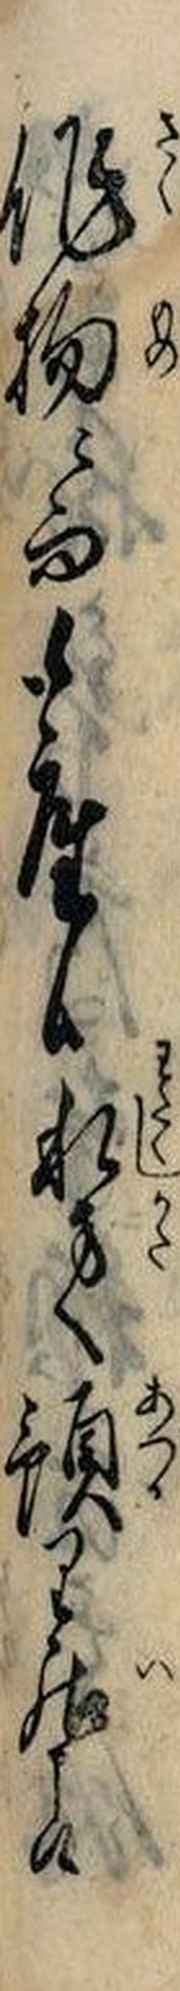作物に而御座候私方へ預り居申候
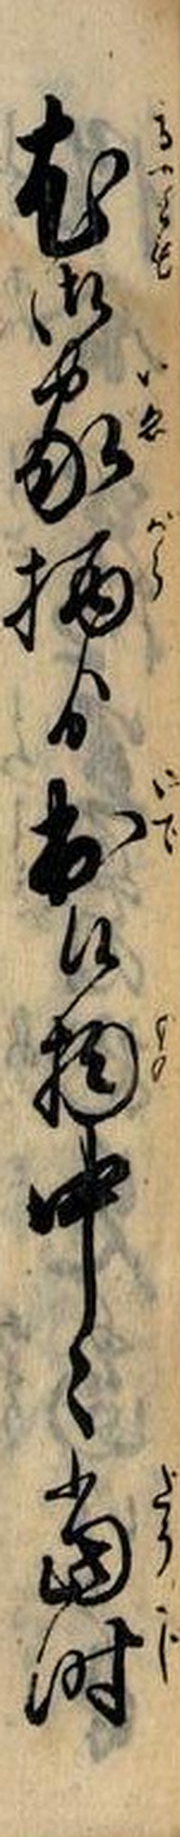尤御家柄ゟ出候物中々當時
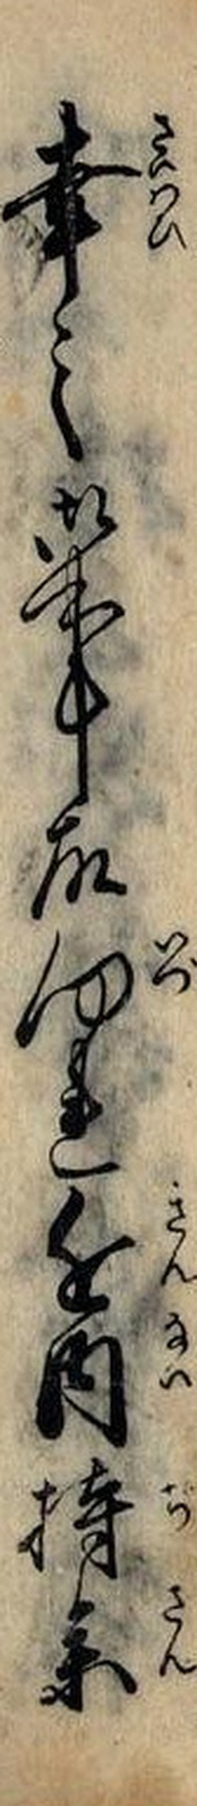幸之御事故何れ近内持参
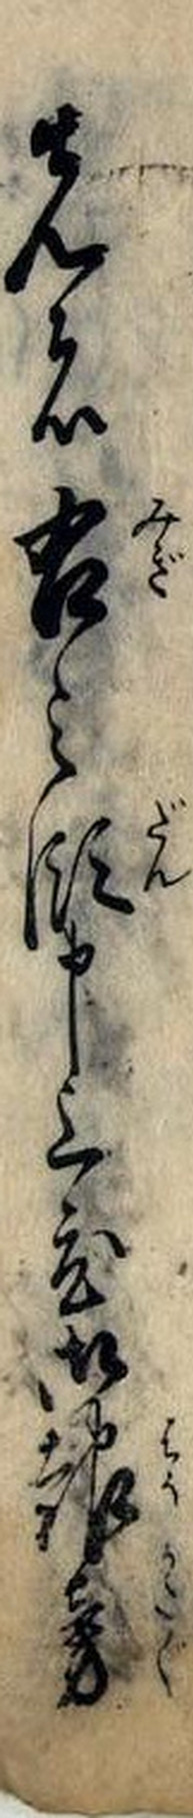先者右之段申上度御報旁

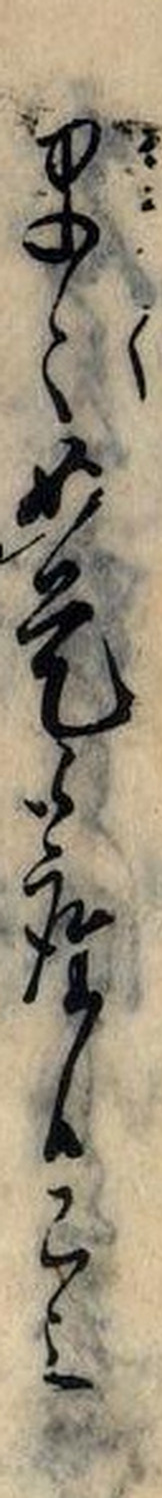早々如是御座候已上
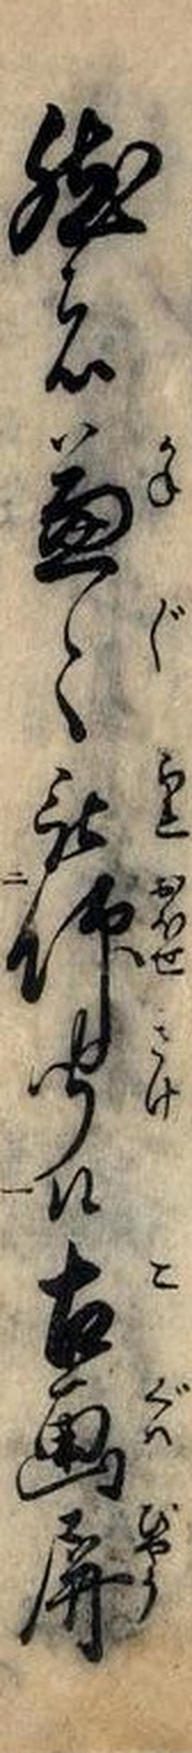然者兼々被仰聞候古画屛
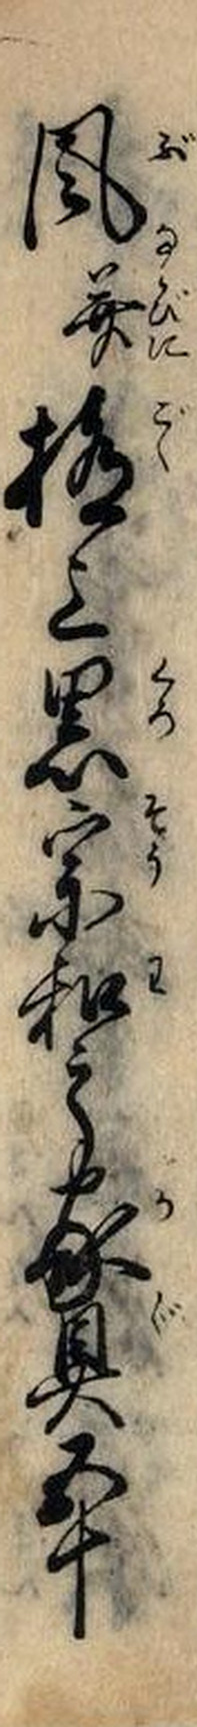風并極上黒宗和之家具五十
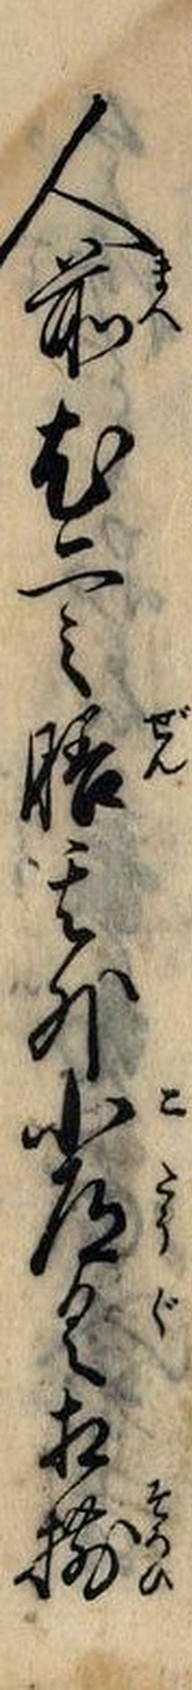人前尤二之膳其外小道具相揃
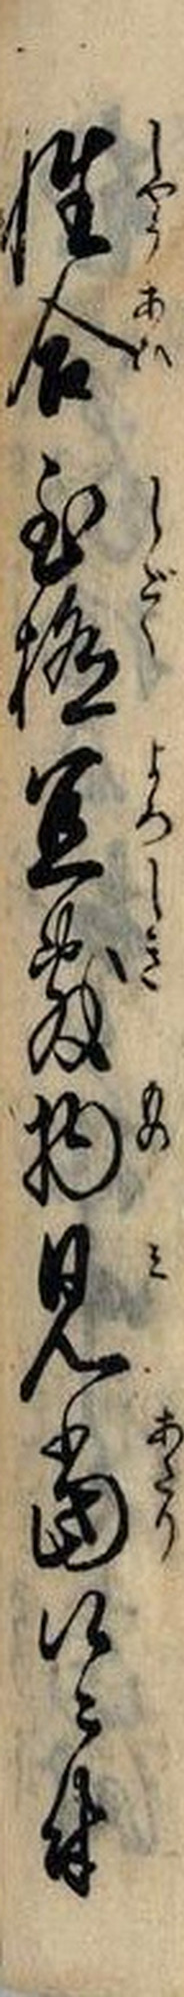性合至極宜敷物見當候に付
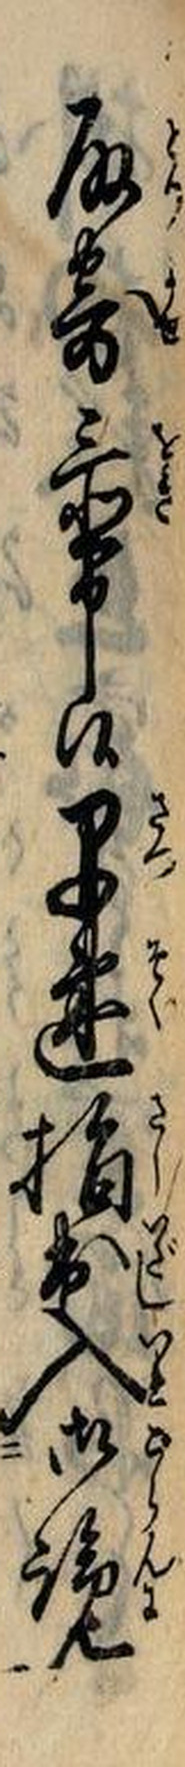取寄置申候早速指出入御覧
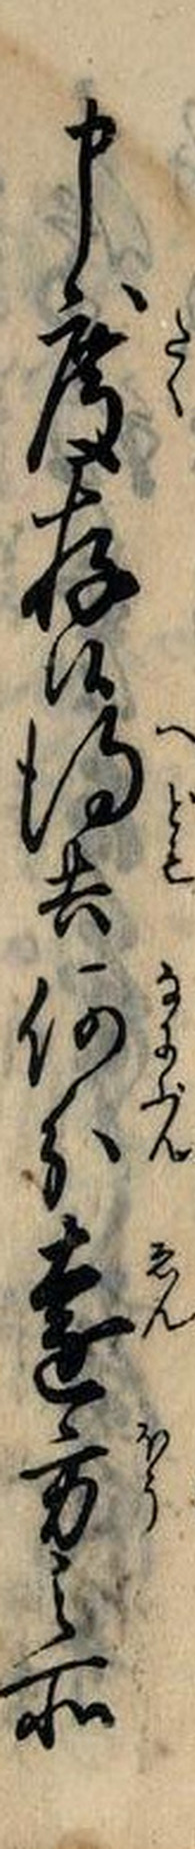申度存候得共何分遠方之所
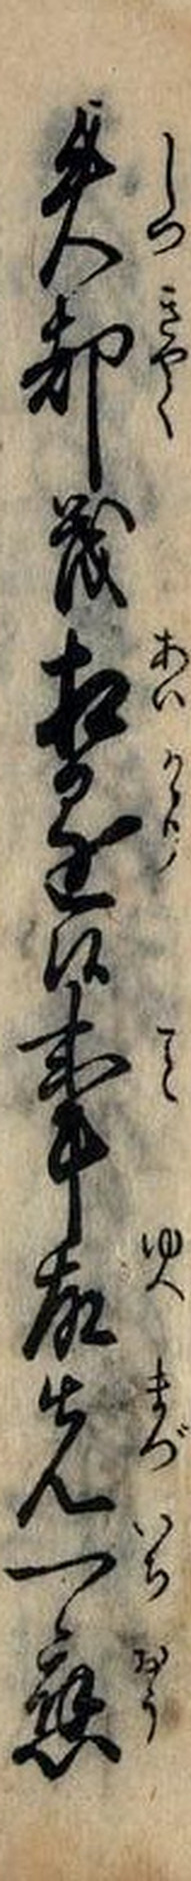失却も相懸候事故先一應
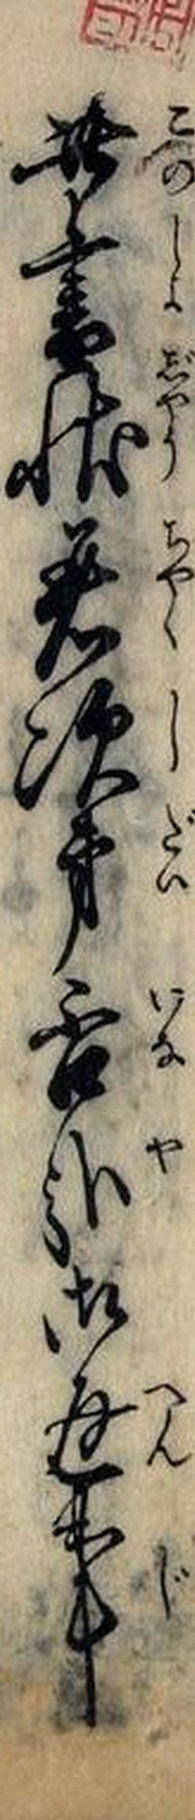此書状着次第否哉御返事

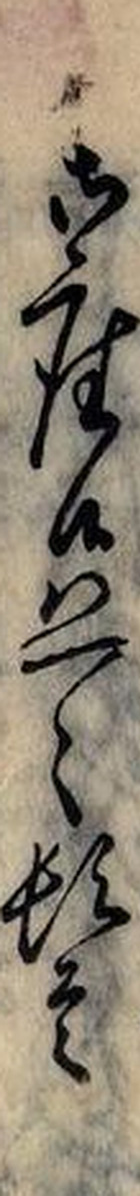御座候恐々頓首
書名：大成用文章（往来物）
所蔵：福井県文書館 Fukui Prefectural Archives
